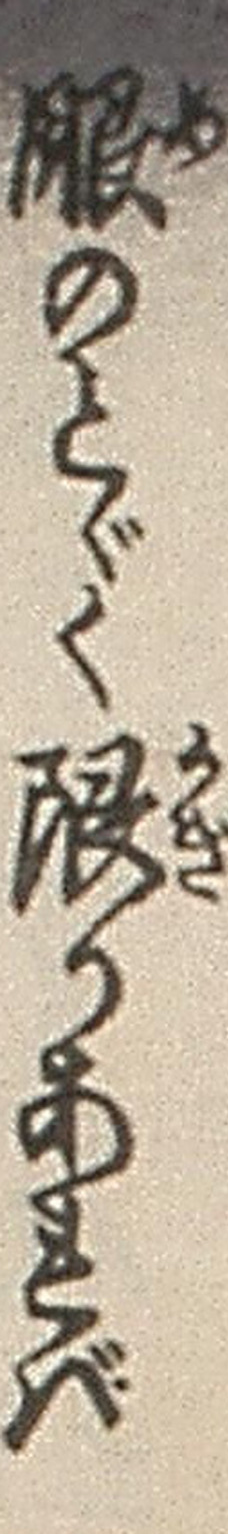眼のとゞく限りあれば
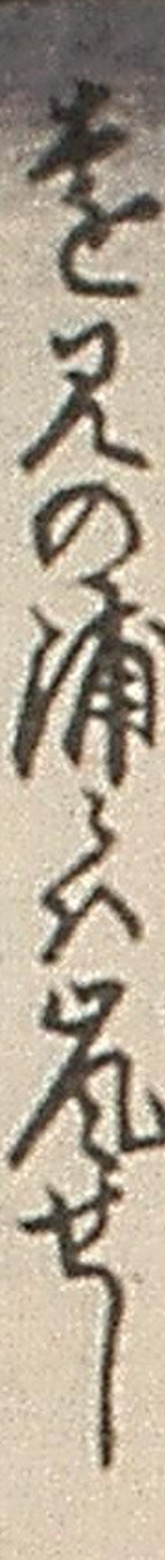遠見の浦〻は嵐せし
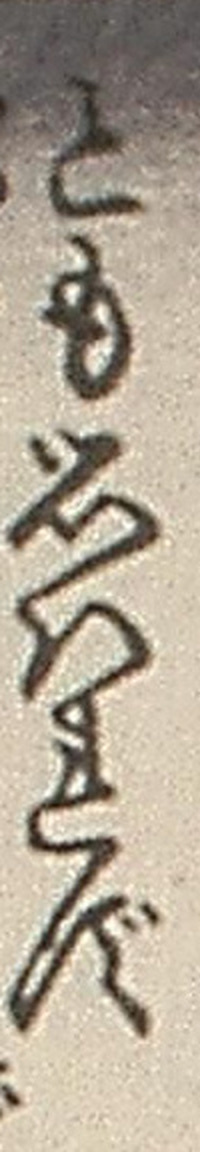とも思はれず
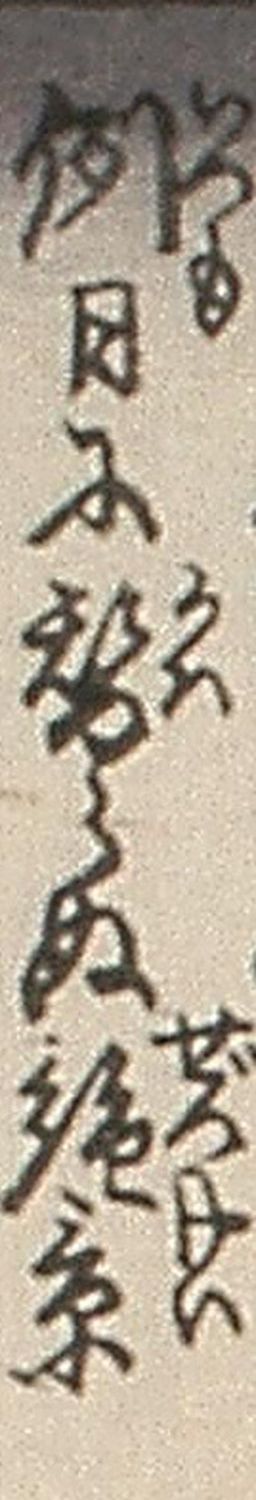例日に替らぬ絶景
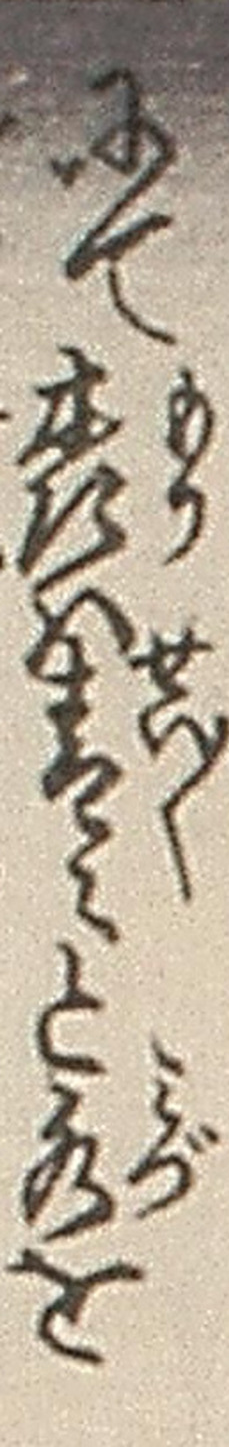にて森は青〻と水を
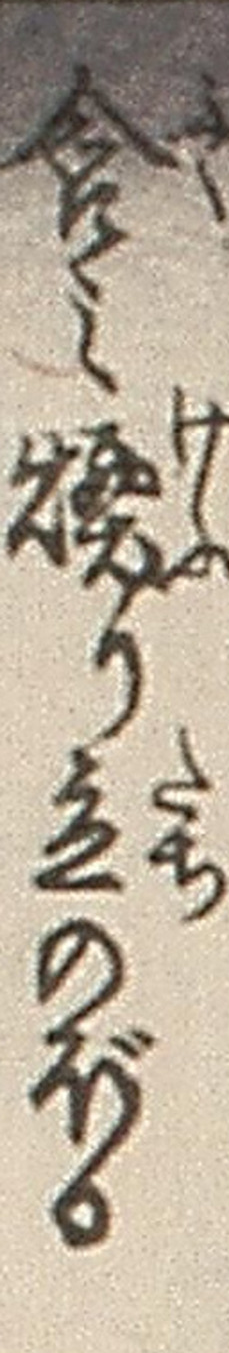含み煙り立のぼる
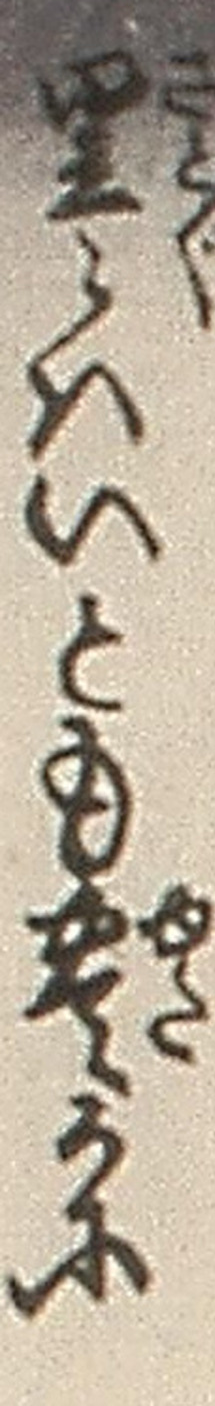里〻はいとも豊かに
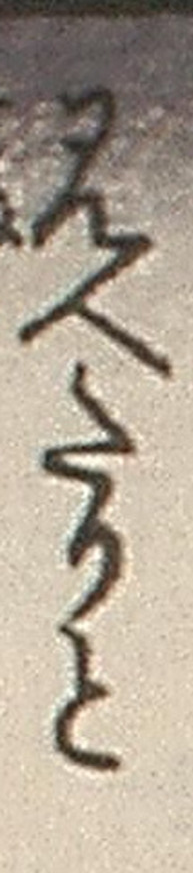見へたりと
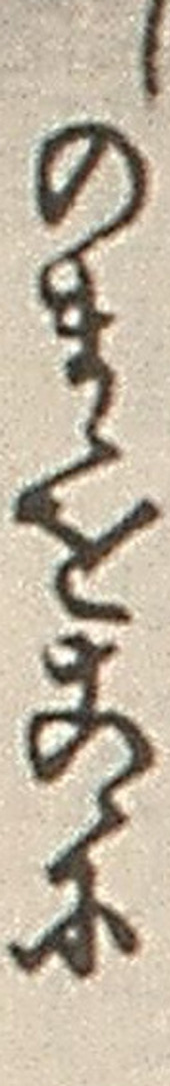咄のまをこゝに
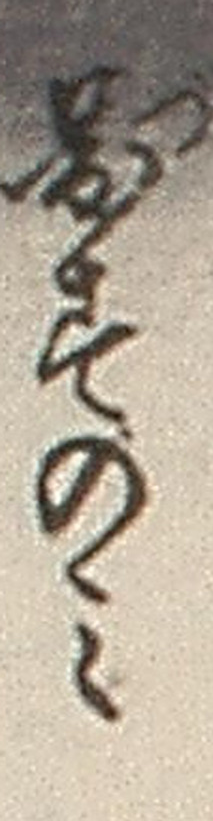図すのみ

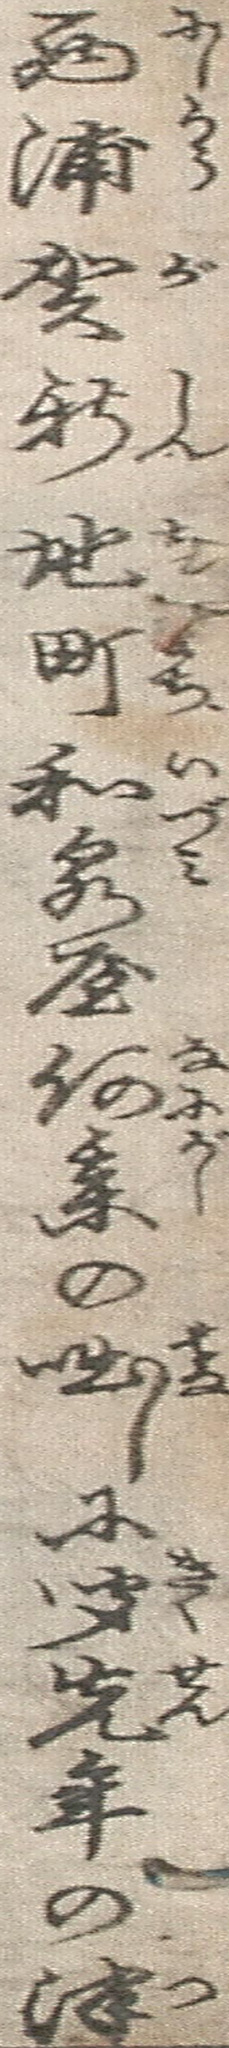西浦賀新地町和泉屋何某の咄しに聞先年の津
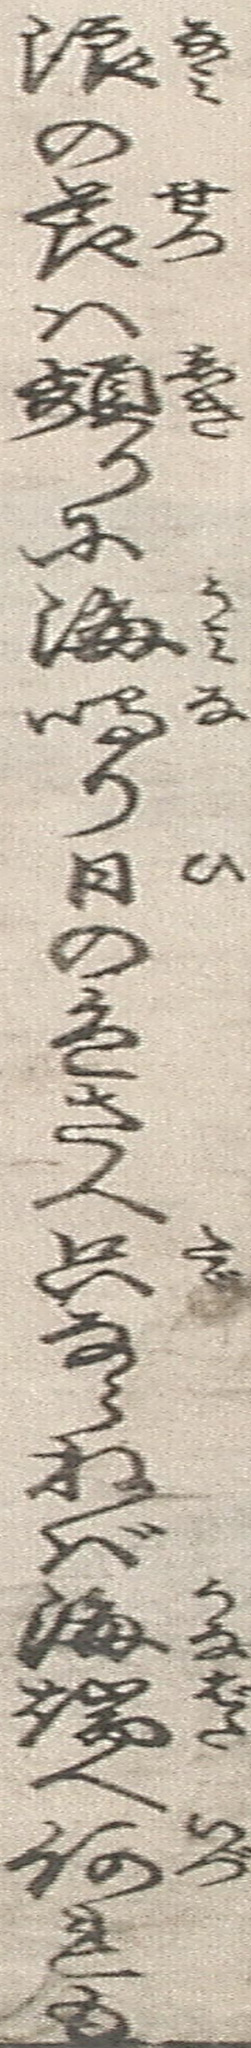浪の節ハ頻りに海鳴り日の色さへ只ならねバ海端へ何れも
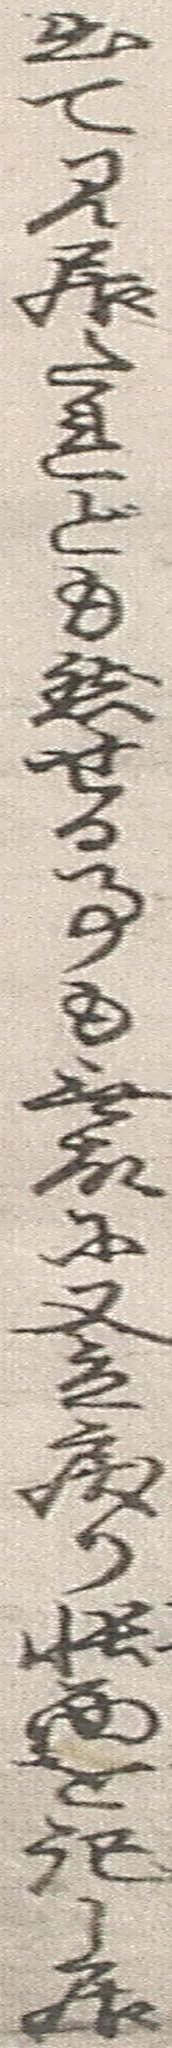出て見居たれとも然せる事も無故に又立戻り帳面を記し居
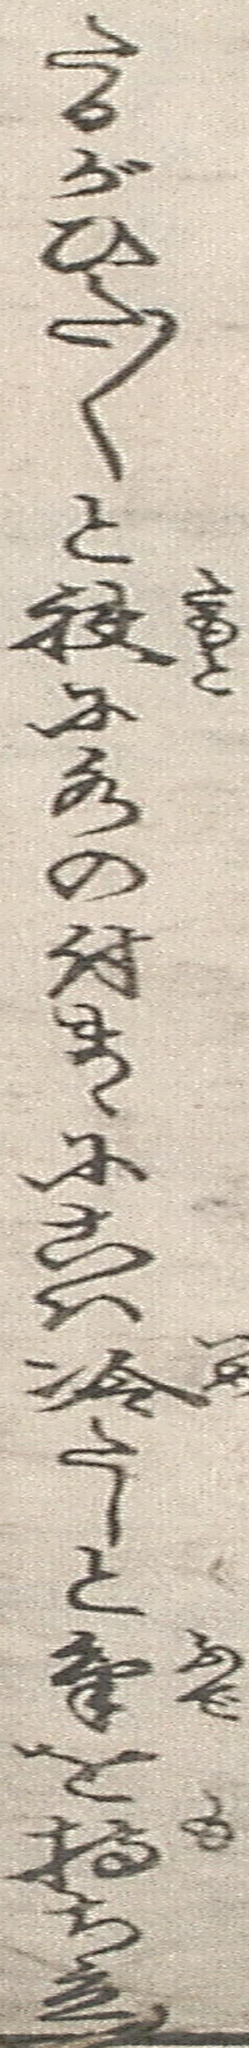たるがひた〳〵と袂に水の付まゝにこハ冷たしと筆を持ち立
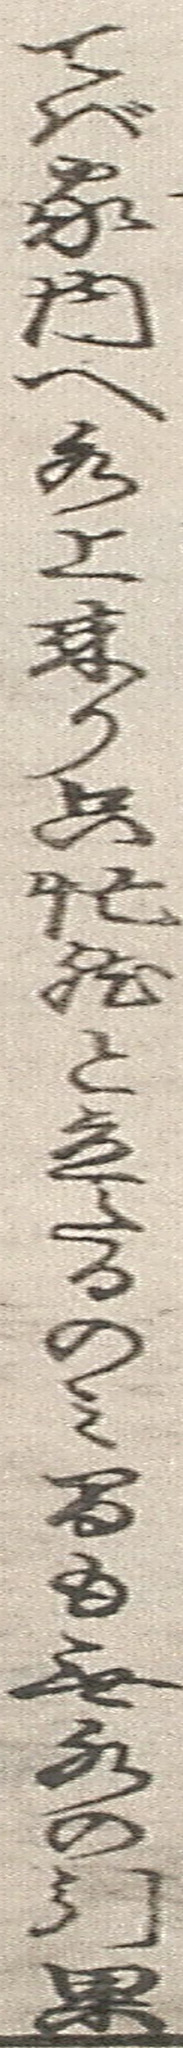てバ家内へ水上来り只茫然と立たるのミ間も無水の引果
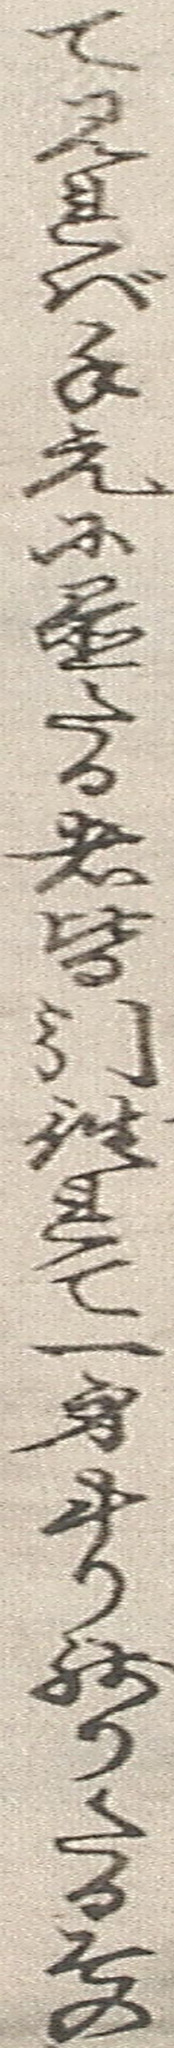て見れバ手元に置たる者皆疋引往れて一身斗り残りたるその
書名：安政風聞集　上中下　全
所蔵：東京大学地震研究所図書室 Earthquake Research Institute Library, The University of Tokyo, JAPAN
